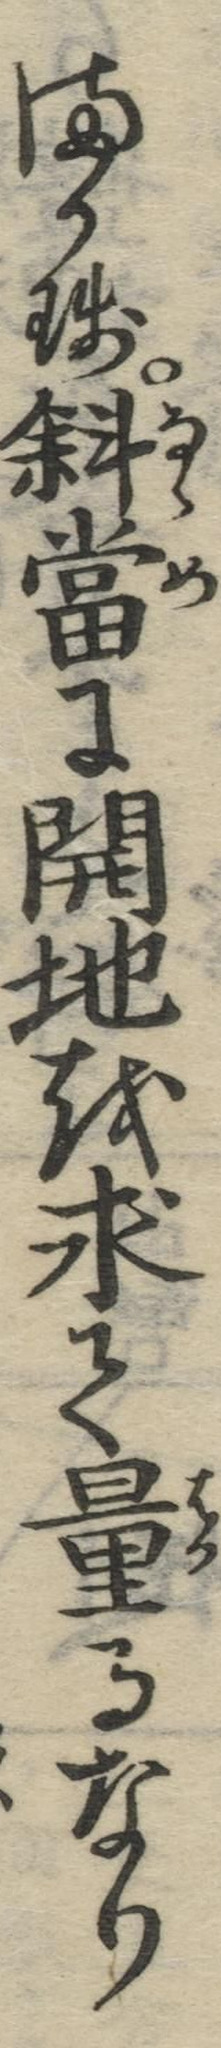まか。斜当に開地を求て量るなり
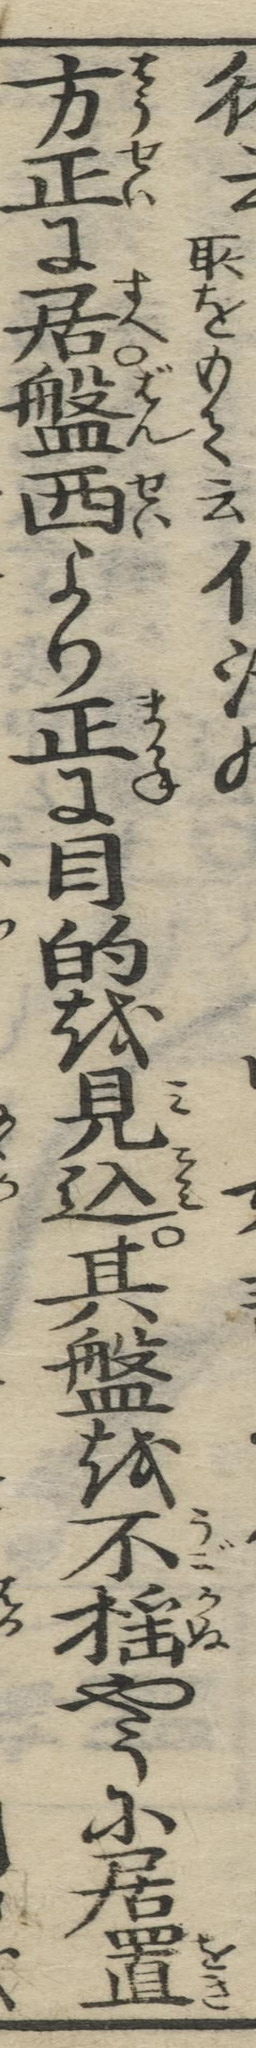方正に居。盤西より正に目的を見込。其盤を不揺やうに居置
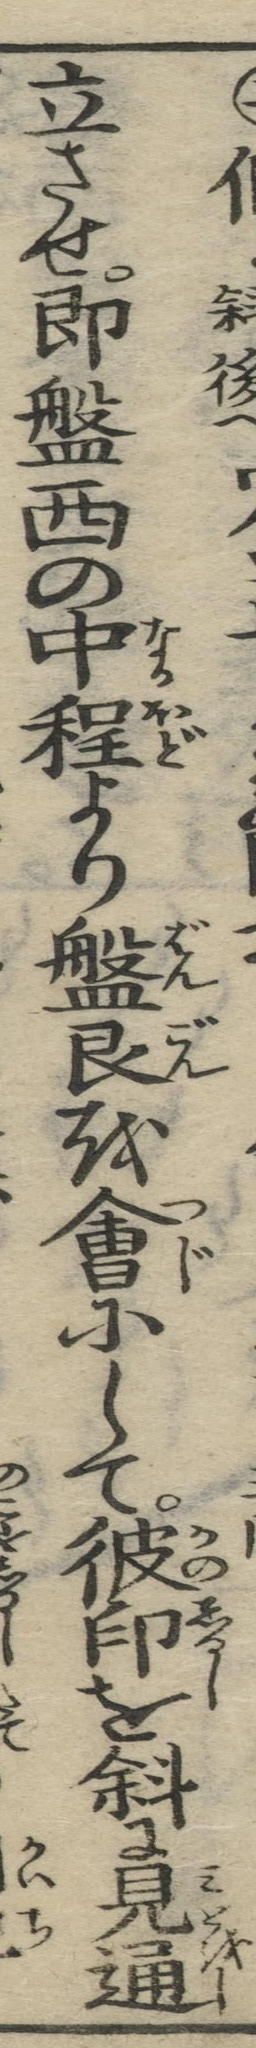立させ。即盤西の中程より盤艮を会にして。彼印を斜に見通

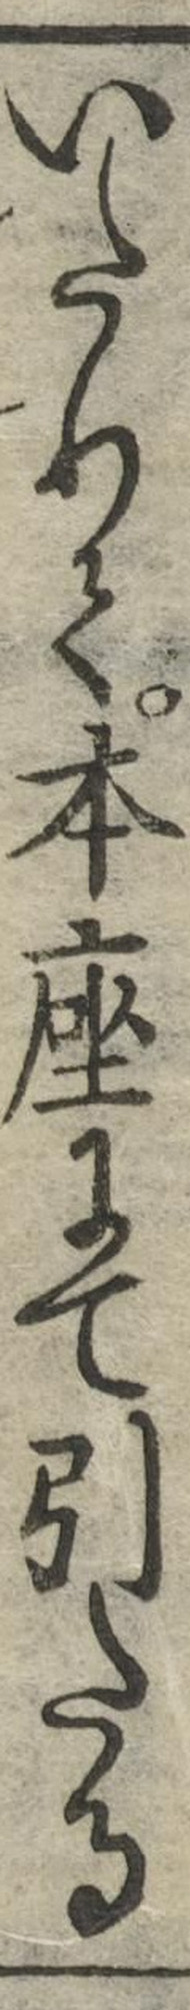いたりて。本座にて引たる
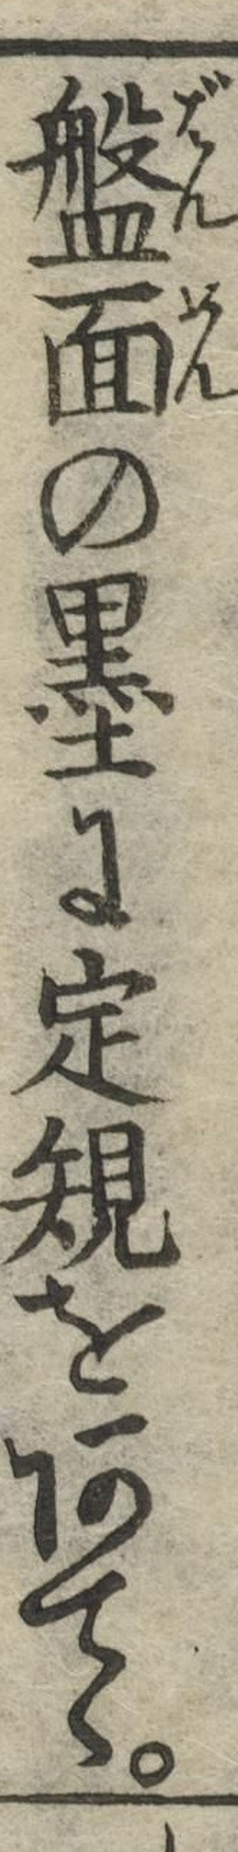盤面の墨に定規をあて。
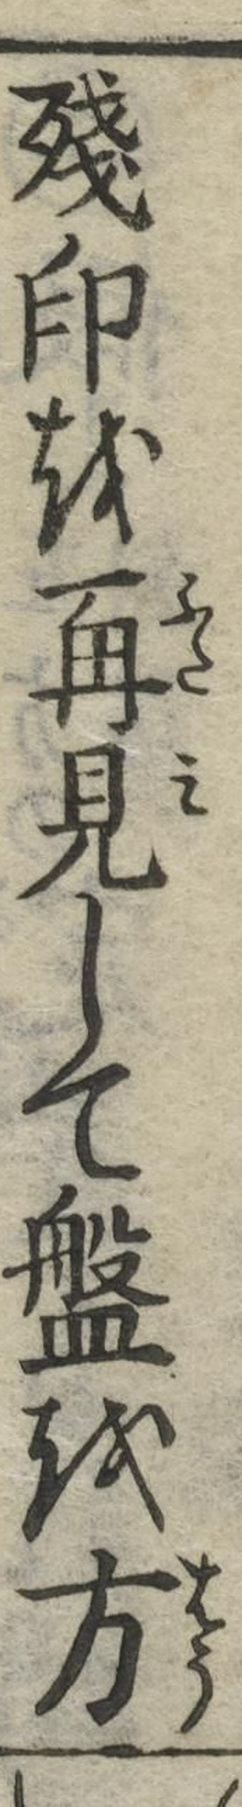残印を再見して盤を方
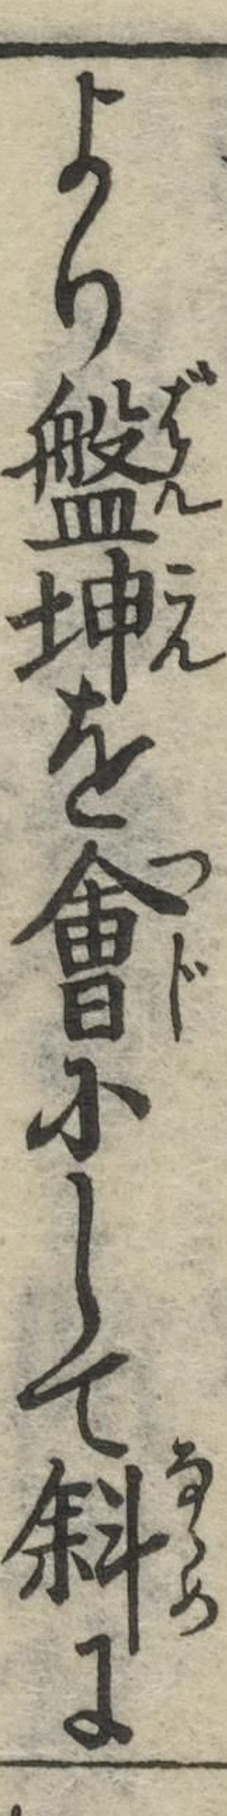より盤坤を会にして斜に
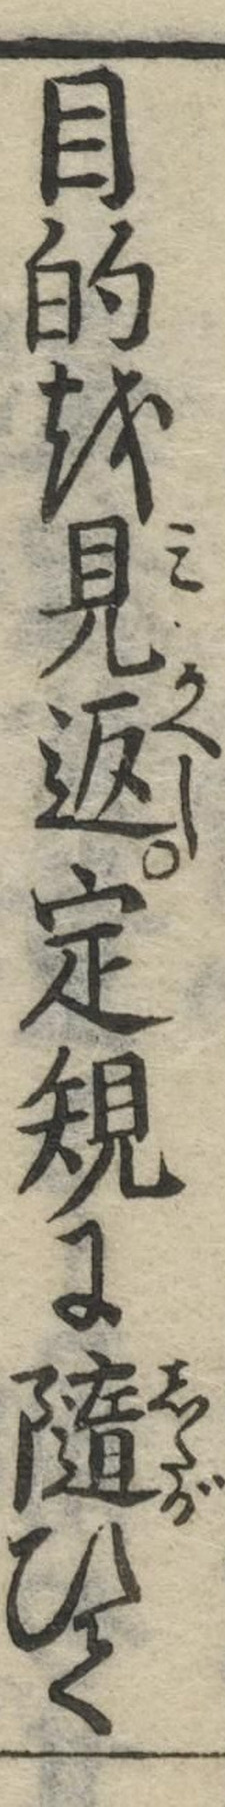目的を見返。定規に随ひて
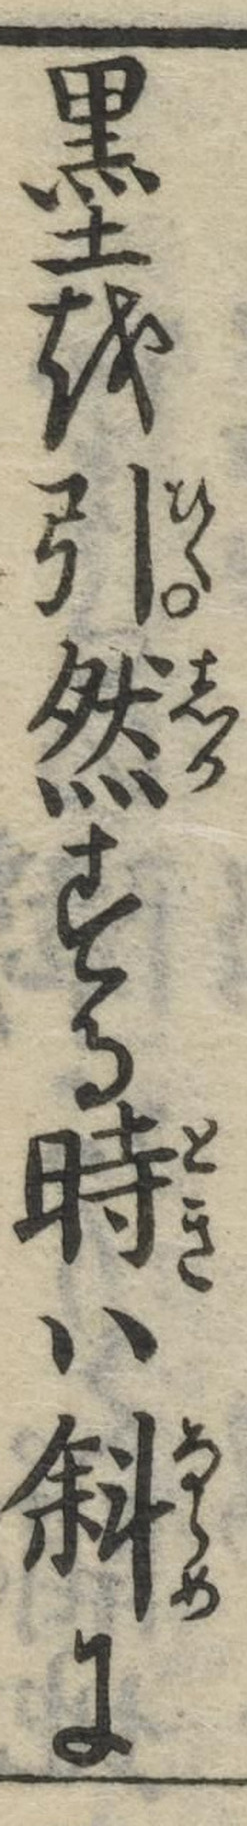墨を引。然する時は斜に
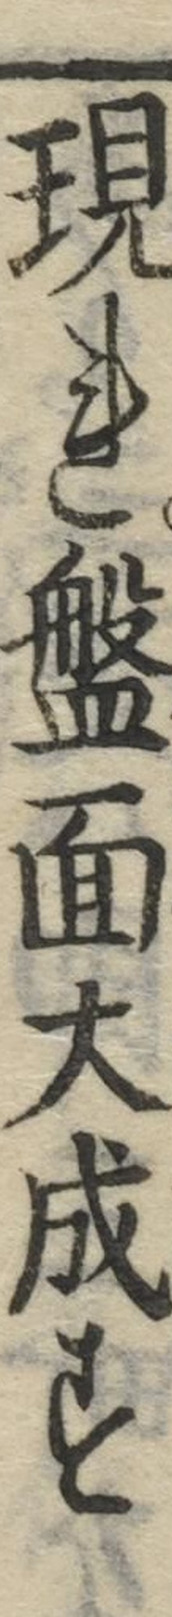現れ。盤面大成す
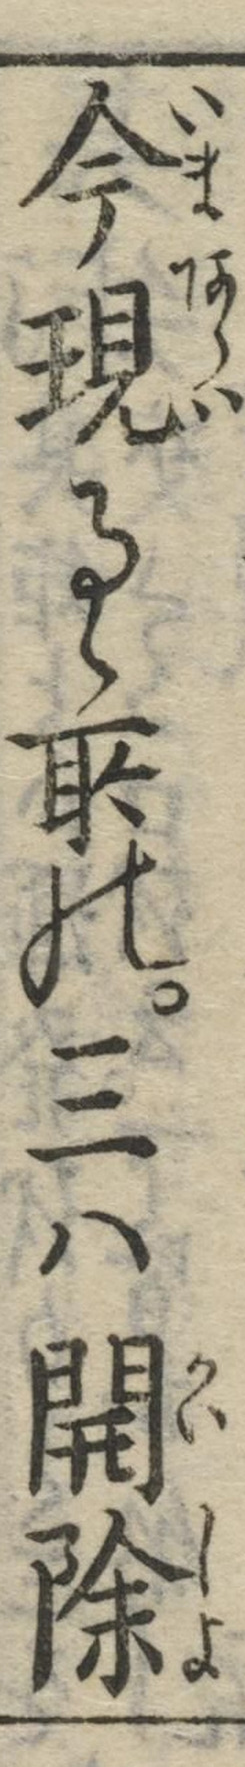今現るゝ所の。三は開除
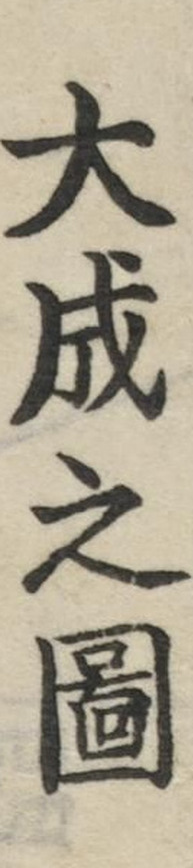大成之図
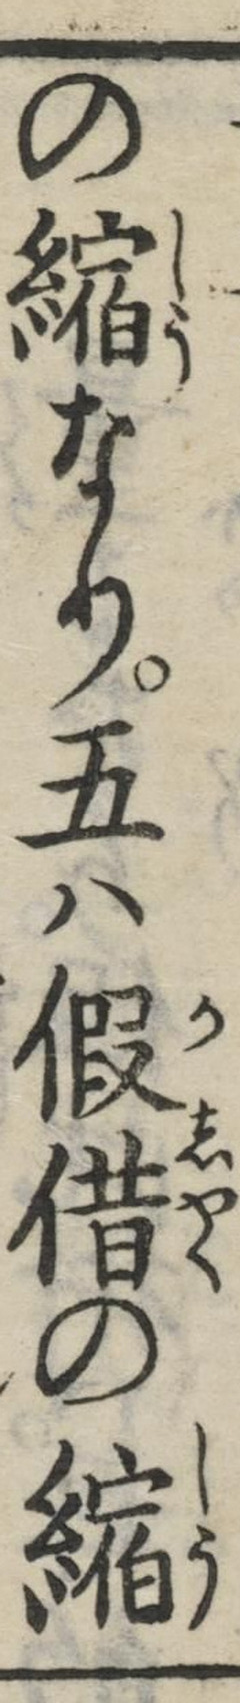の縮なり。五は仮借の縮
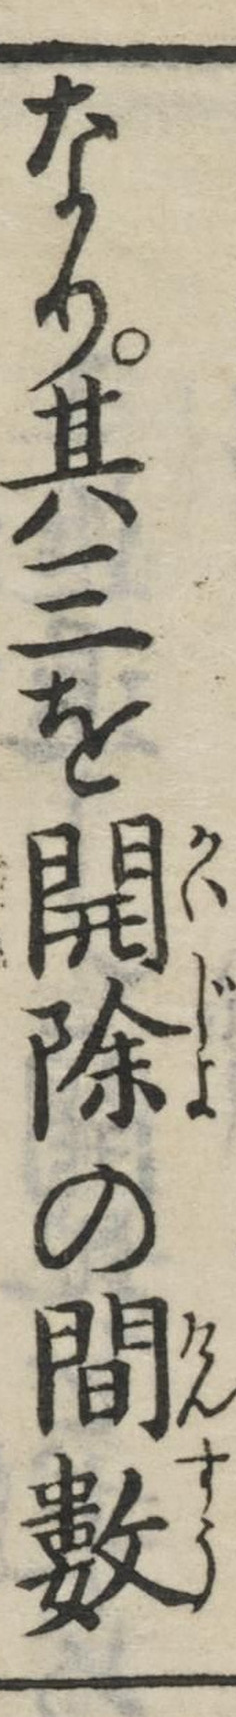なり。其三を開除の間数
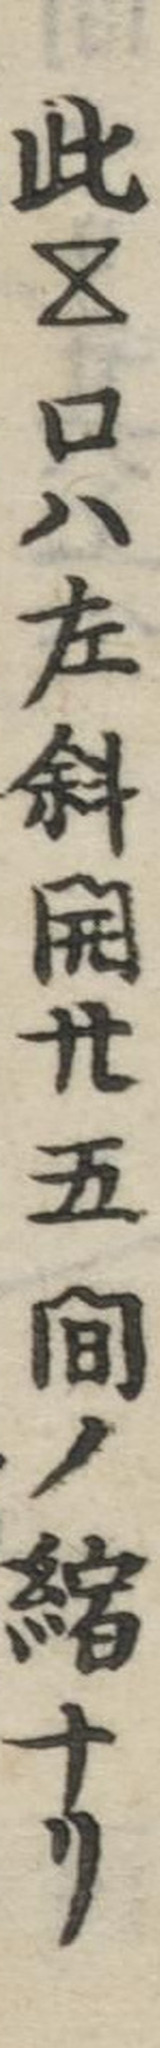此▽△口ハ左斜開廿五間ノ縮ナリ
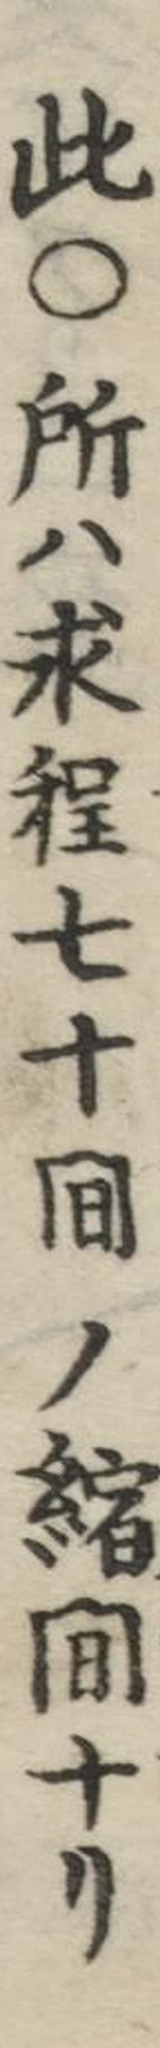此○所ハ求程七十間ノ縮間ナリ
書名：量地指南　巻之二（内題）
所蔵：東京大学地震研究所図書室 Earthquake Research Institute Library, The University of Tokyo, JAPAN
